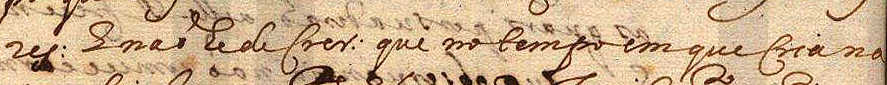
zes: E naõ he de Crer: que no tempo em que Cria na
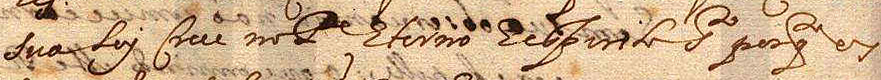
sua Ley Cree no Pe Eterno E espirito Sto porqto os
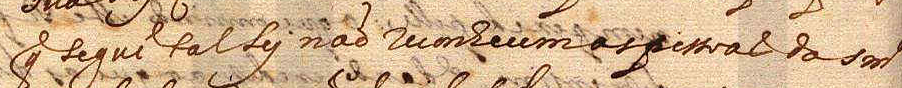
q̄ seguē tal lej naõ reconhecem as pessoas da sma
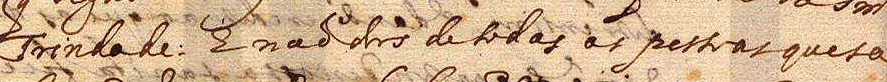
Trindade: E naõ dis de todas as pessoas que sa
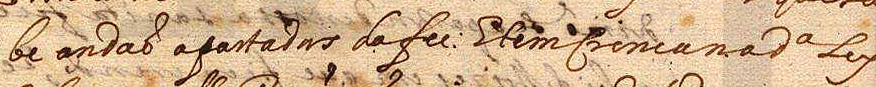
be andaõ apartadas da fee: E tem Crença na da Ley
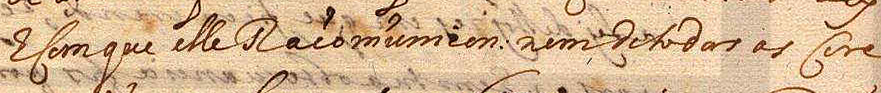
E Com que elle R a c̄om̄unicou nem, de todas as Cere
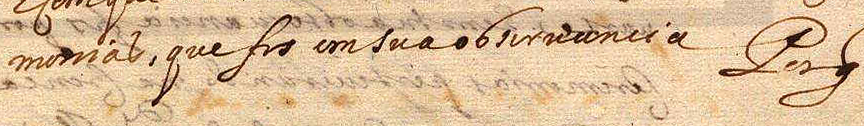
monias, que fes em sua obseruancia Porq̄
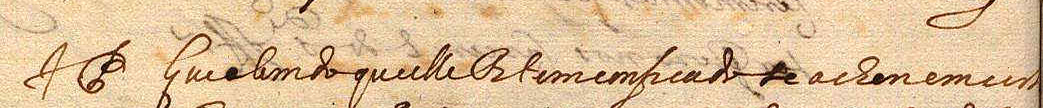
4 P Que alem do que elle R tem confeçado se achou em cer
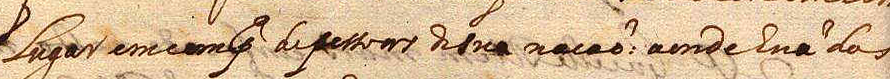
Lugar em compa de pessoas de sua naçaõ: aonde huā das
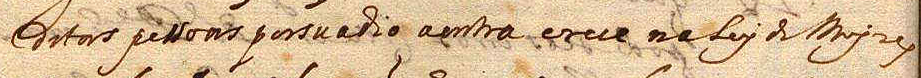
ditas pessoas persuadio a outra crece na Ley de Mojzes
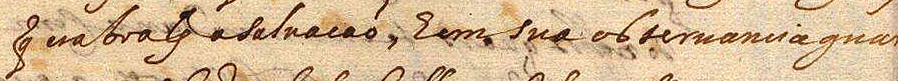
q̄ era boa pa a saluaçaõ, E em sua obseruancia guar
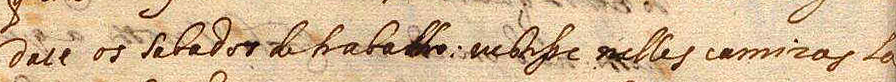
dace os sabados de trabalho: uestisse nelles camizas La
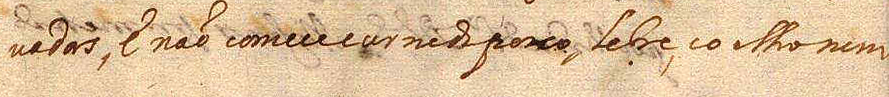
uadas, e naõ comece carne de porco, lebre, coelho nem
